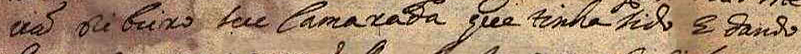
uaõ Ribeiro seu Camarada que tinha sido E dando
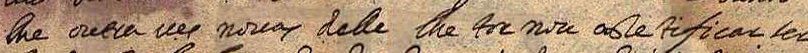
lhe outra ues nouas delle lhe tornou a Retificar ser
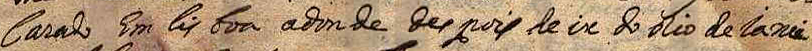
Cazado Em lisboa adonde despois de ir do Rio de Ianei
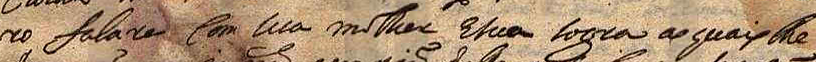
ro falara Com sua molher E sua sogra as quais lhe
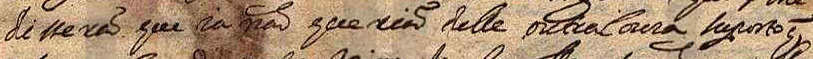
disseraõ que ia não queriaõ delle outra Couza suposto q̄
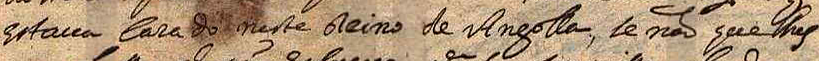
Estaua Cazado neste Reino de Angolla, senão que lhes
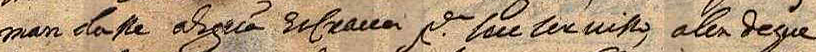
mandasse alguā EsCraua pa seu seruisso, alen de que
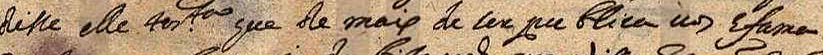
disse elle test.a que de mais de ser publica uos E fama
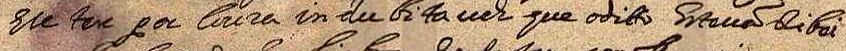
E se ter por Couza indubitauel que o ditto Esteuaõ Ribei
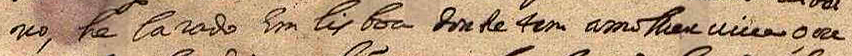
ro, he Cazado Em lisboa donde tem a molher uiua o ou
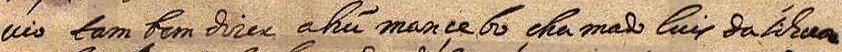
uio tambem dizer a hū mancebo chamado luis da silua
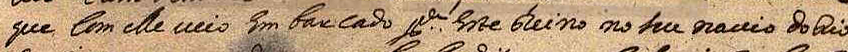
que Com elle ueio Embarcado p.a Este Reino no seu nauio do Rio
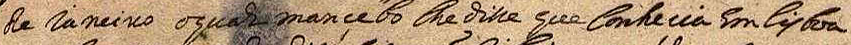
de Ianeiro o qual mancebo lhe disse que Conheçia Em lisboa
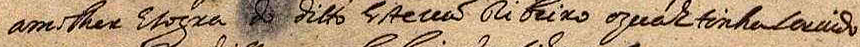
a molher E sogra do ditto Esteuaõ Ribeiro o qual tinha seruido
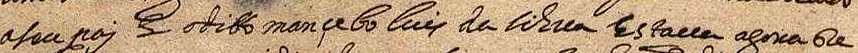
a seu paj E o ditto mançebo luis da silua Estaua agora Re
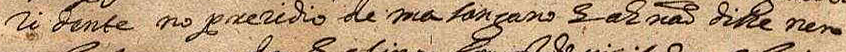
zidente no prezidio de masangano E al não disse nen
